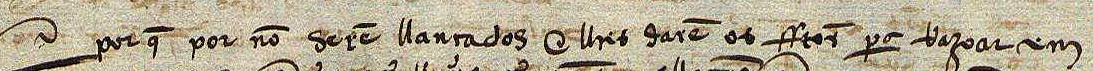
e porq̄ por nō serē llançados e lhes darē os fftos ꝑa Razoar em
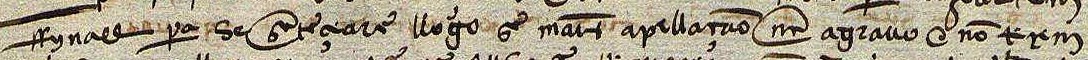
ffynall ꝑa se sētēcearē llogo sē mais apellação nē agrauo e nō terem
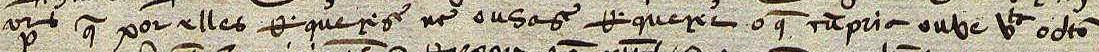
pors q̄ por elles Requeresē nē ousasē Requerer o q̄ cūpria ouve vta o dtō
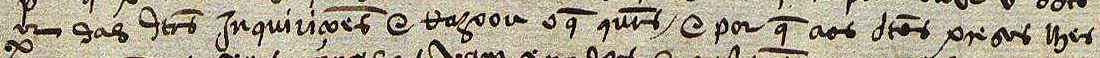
por das dtās Jnquirições e Razoou o q̄ quis / e porq̄ aos dtōs presos lhes
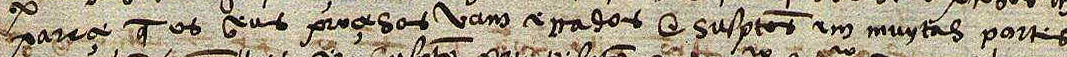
parece q̄ os seus procesos vam errados e susptōs em muytas partes
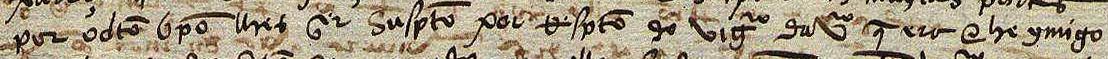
por o dtō bpō lhes ser suspt̄o por Resptō do vigro daVro q̄ era e he ymigo
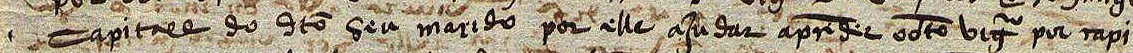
Capitall do dtō seu marido por elle aJudar a pr̄eder o d̄to vigro por capi
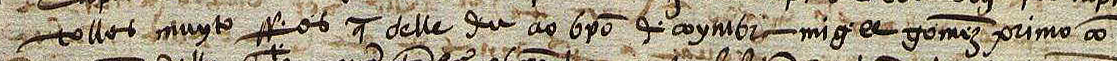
tollos muyto ffeos q̄ delle deu ao bpō de coymbra migell gomez primo c̄o
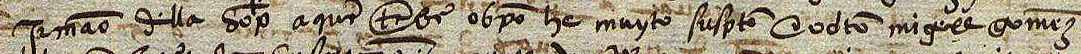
Jrmão della sopte a quē tābē o bp̄o he muyto susptō e o dtō migell gomez
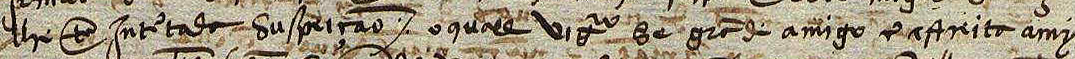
lhe tē Jntētada suspeição ./. o quall vigro he grāde amigo ē estreita amy
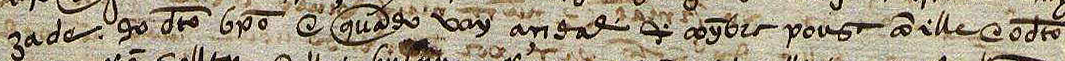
zade do dt̄o bpō e quādo vay a cidade de coȳbra pousa c̄o elle e o dtō
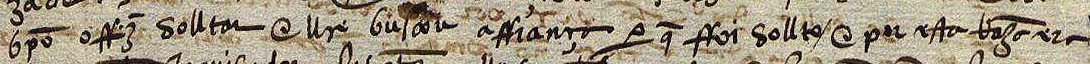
bpō o ffez solltar e lhe buscou a ffiança ꝑ q̄ ffoi sollto / e por esta Raz̄a era
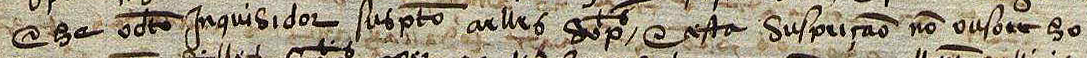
e he o d̄to Jnquisidor susptō a elles soptes / e esta suspeição nō ousou ho
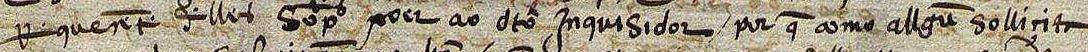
Requerēte delles soptes poer ao dtō Jnquisidor / porq̄ como allgū sollicita
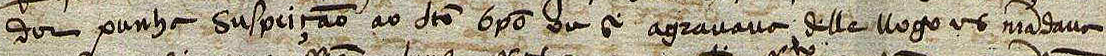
dor punha suspeição ao dtō bpō ou se agrauaua delle logo os mādaua
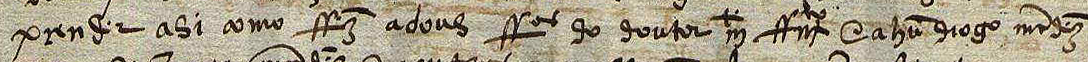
prender asi como ffez a dous ffos do doutor mte ffrrco e a hū diogo mēdez
